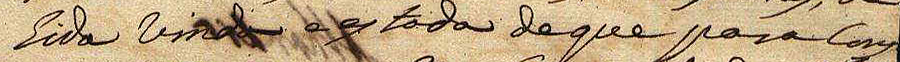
hida vinda e estada de que para cons
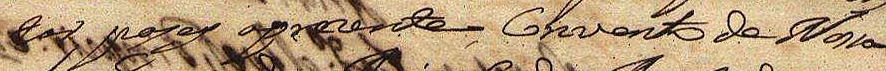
tar, pasey o prezente, Convento de Nossa
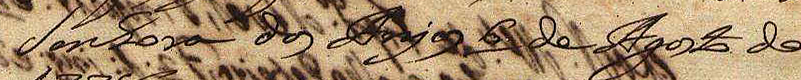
Senhora dos Anjos 6 de Agosto de
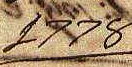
1778
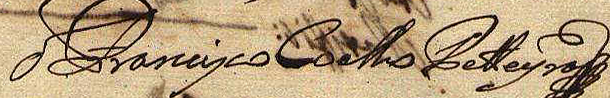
o Francisco Coelho Petteyra
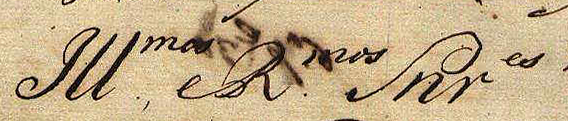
Ill.mos e R.mos Snr.es
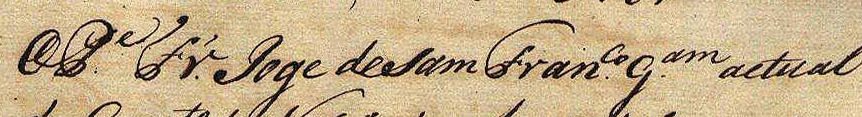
O P.e Fr. Ioge de Sam Fran.co G.am actual
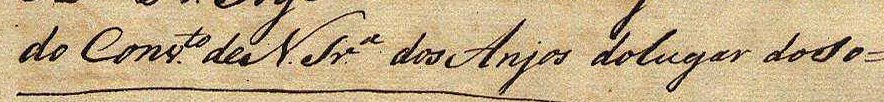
do Conv.to de N. Sr.a dos Anjos do lugar do so
